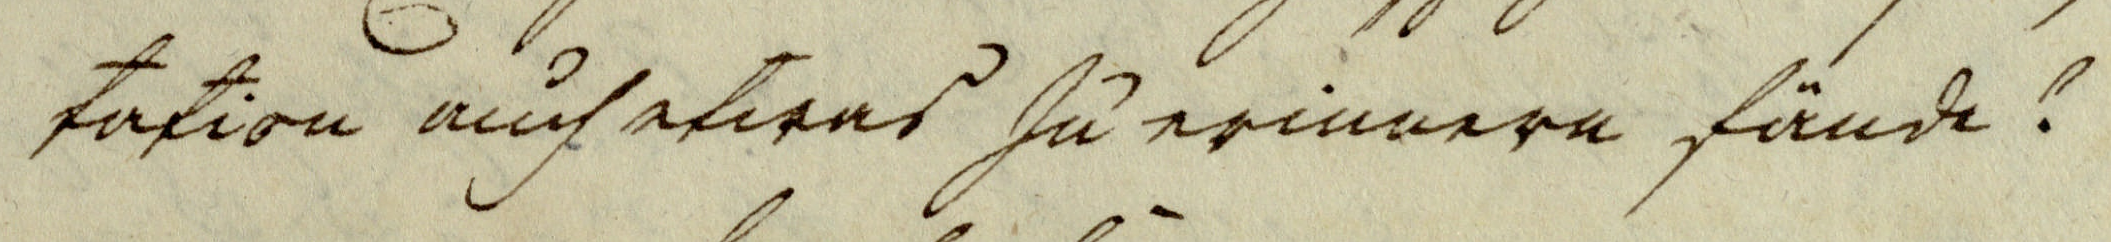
tation auch etwas zu erinnern fände?
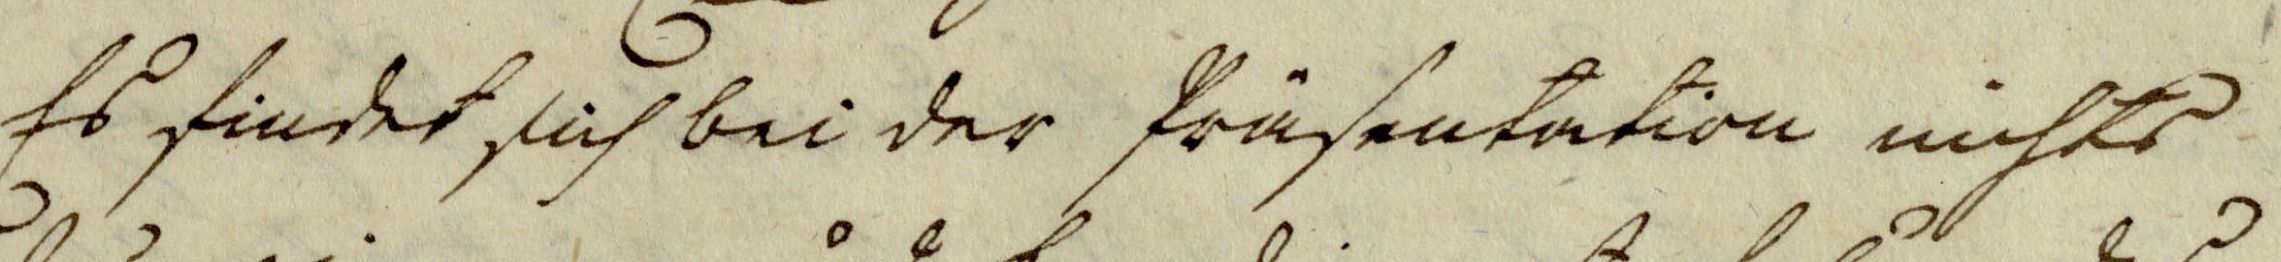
Es findet sich bei der Präsentation nichts
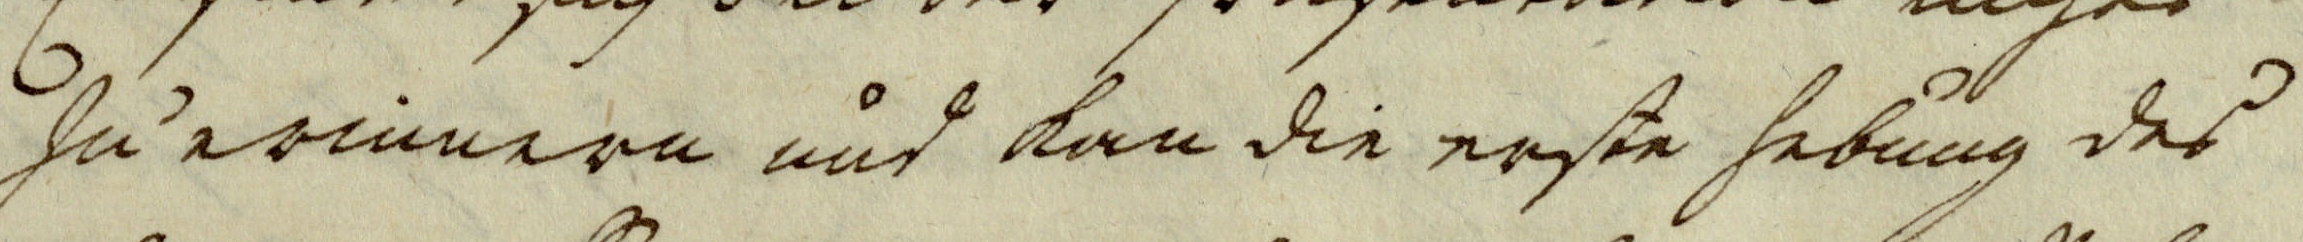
zu erinnern und kan die erste Hebung des
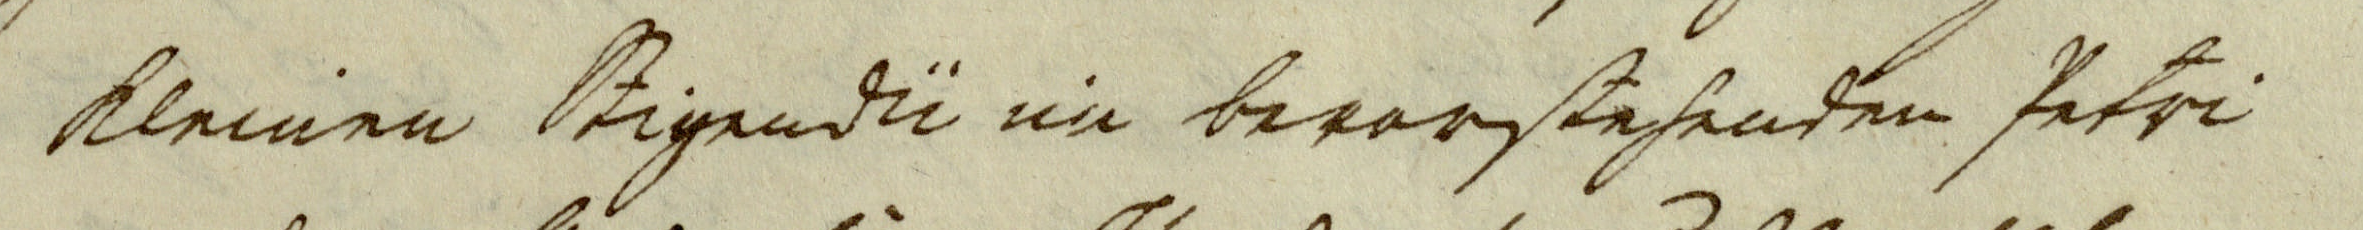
kleinen Stipendii im bevorstehenden Petri
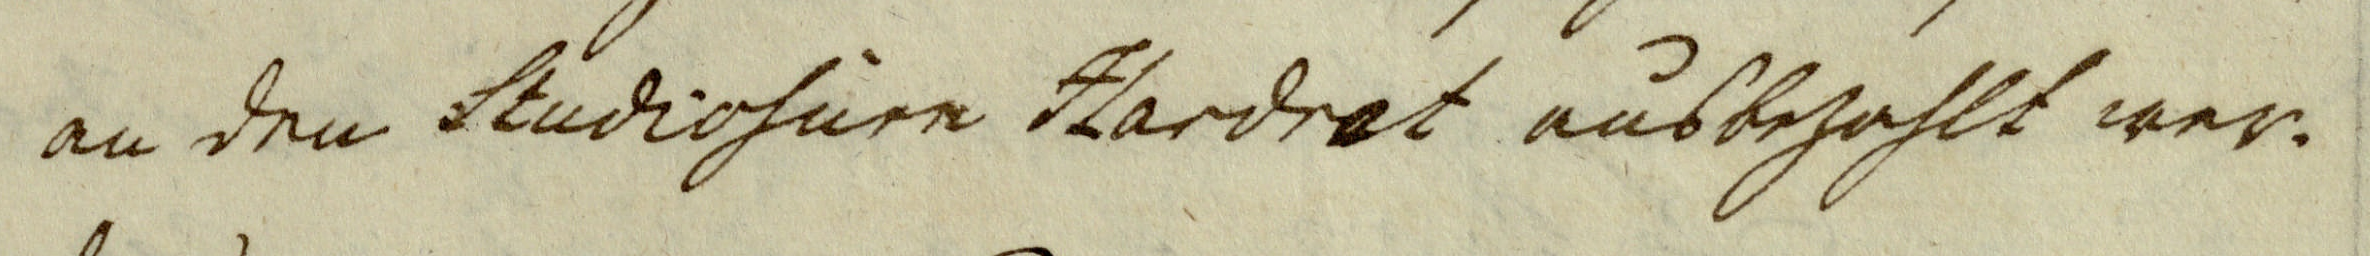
an dem Studiosum Hardrat ausbezahlt wer¬
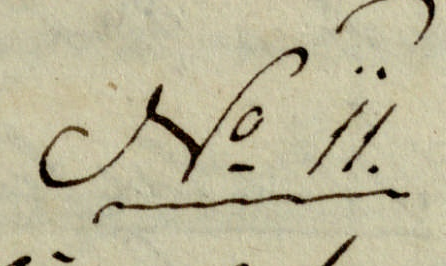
No 11.
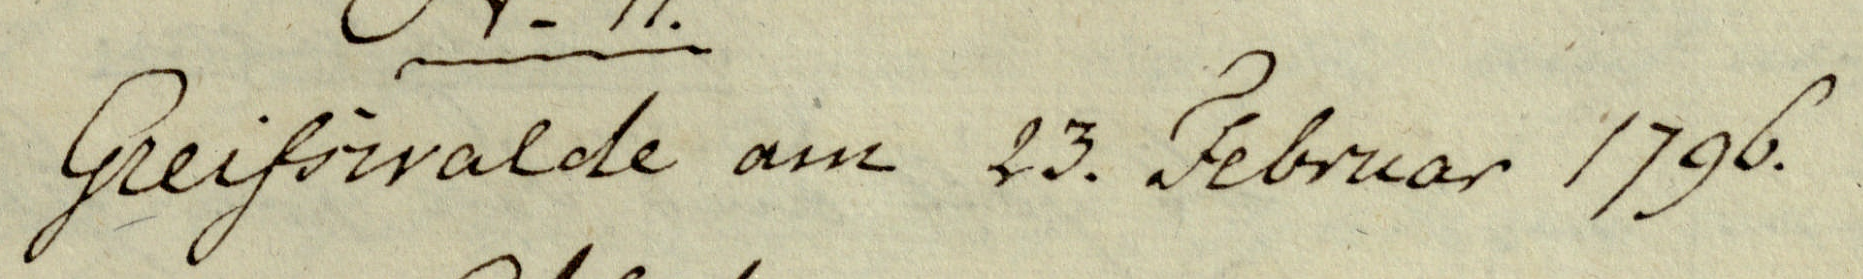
Greifswalde am 23. Februar 1796.
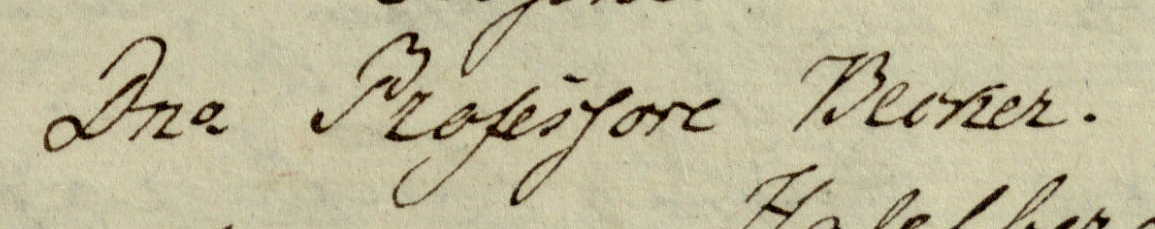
Dn Professore Becker.
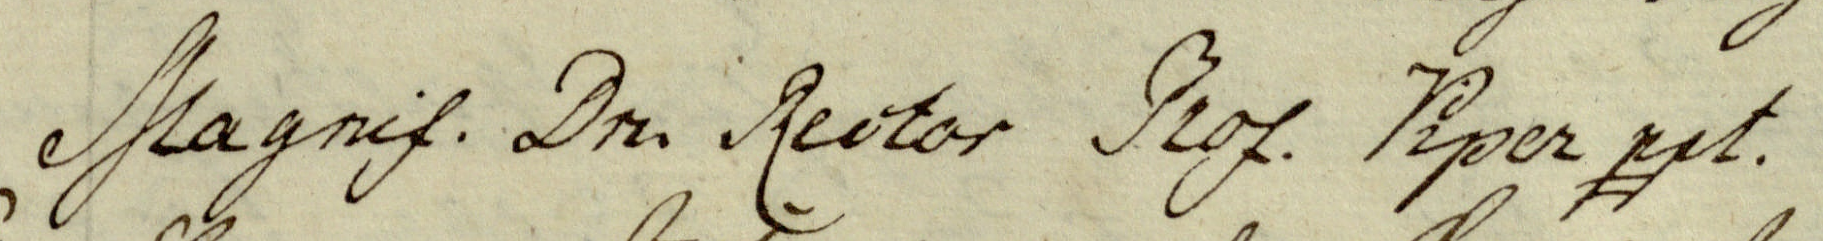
Magnif. Dn. Rector Prof. Piper ppt.
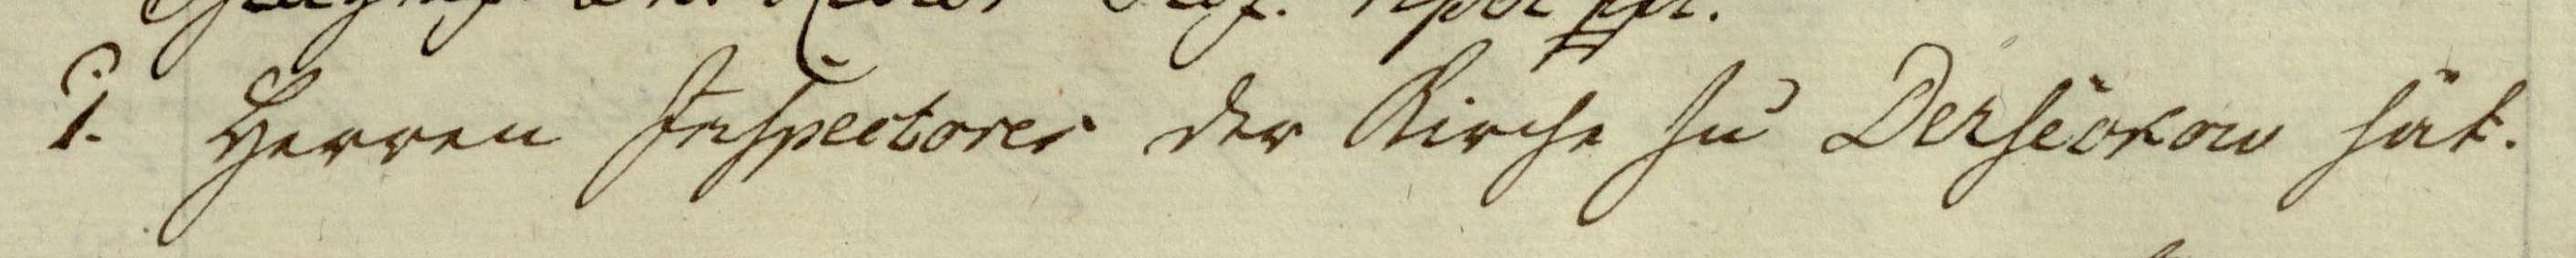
1. Herren Inspectores der Kirche zu Derseckow hät¬
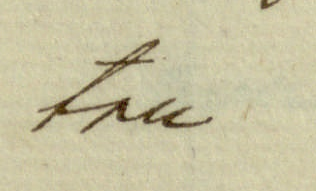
ten
